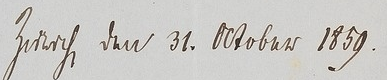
Zürich den 31. October 1859.
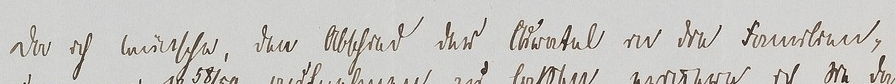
Da ich wünsche, den Abschied der Curatel in die Familien-
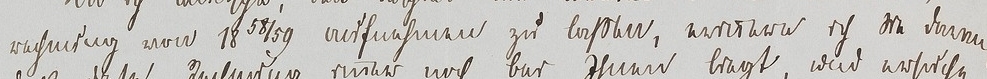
rechnung von 1858/59 aufnehmen zu lassen, erinnere ich Sie daran,
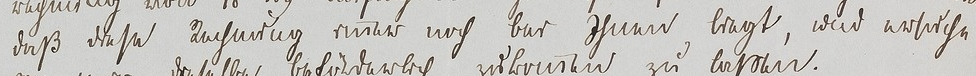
daß diese Rechnung immer noch bei Ihnen liegt, und ersuche
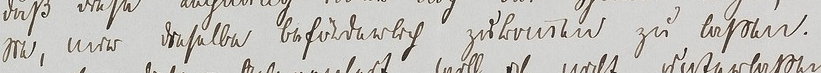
Sie, mir dieselbe beförderlich zukommen zu lassen.
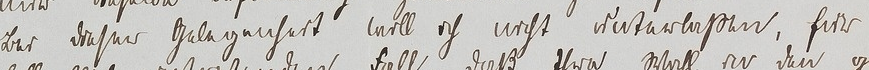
Bei dieser Gelegenheit will ich nicht unterlassen, für
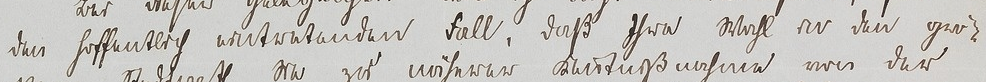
den hoffentlich eintretenden Fall, daß Ihre Wahl in den gro-
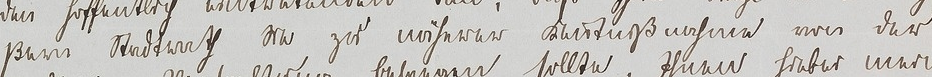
ßen Stadtrath Sie zu näherer Kenntnißnahme von der
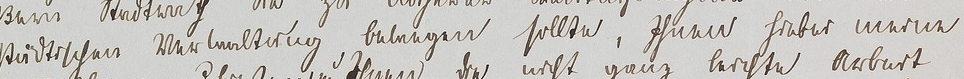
städtischen Verwaltung bewegen sollte, Ihnen hiebei meine
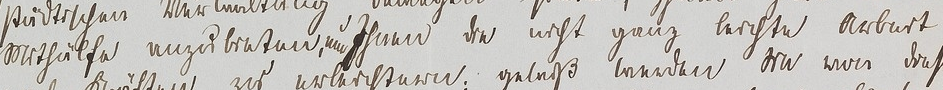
Mithülfe anzubieten um Ihnen die nicht ganz leichte Arbeit
